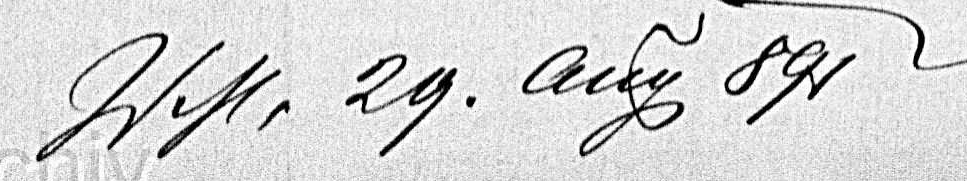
Ischl 29. August 1891
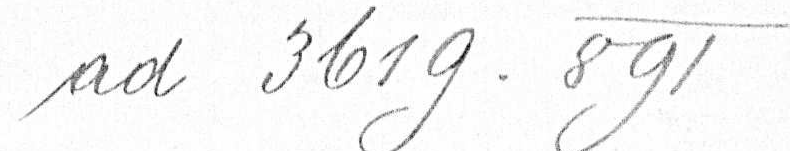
ad 3619 1891
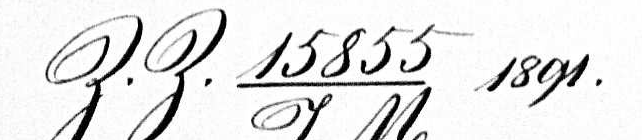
ZZ 15855/ – 1891
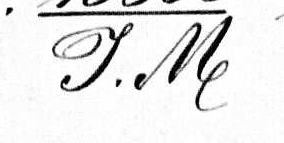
JM
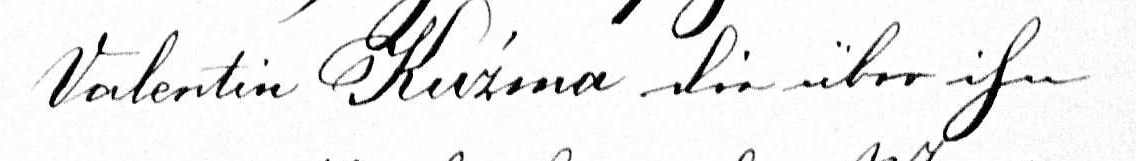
Valentin Kuźma die über ihn
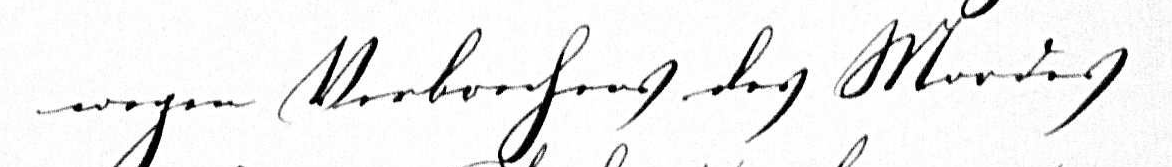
wegen Verbrechens des Mordes
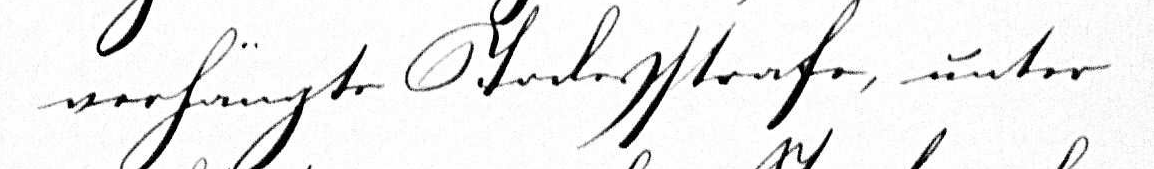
verhängte Todesstrafe unter
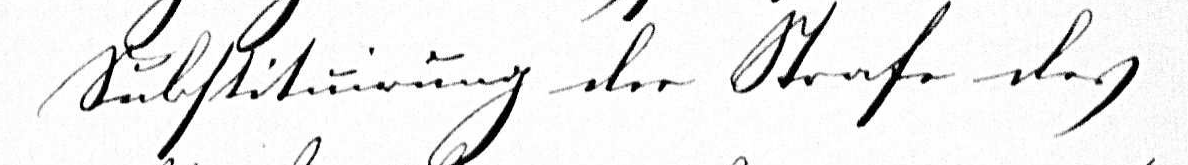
Substituirung der Strafe des
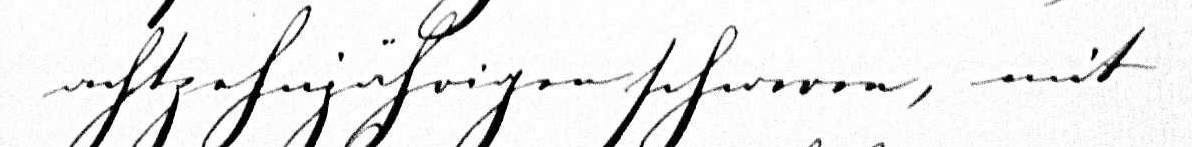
achtzehnjährigen schweren, mit
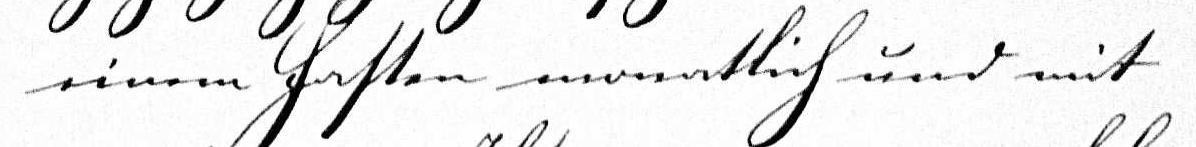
einem Fasten monatlich und mit
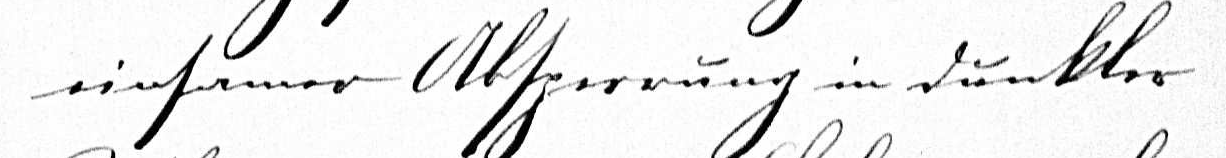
einsamer Absperrung in dunkler
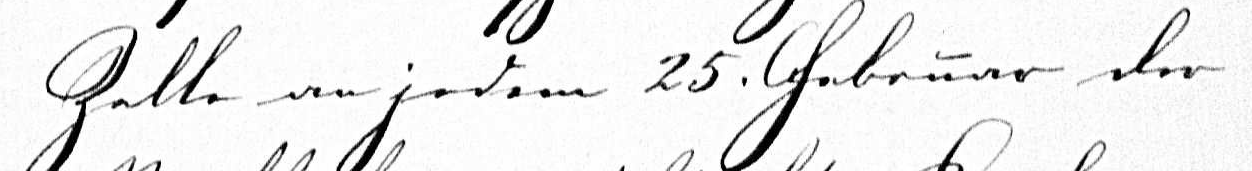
Zelle an jedem 25. Februar der
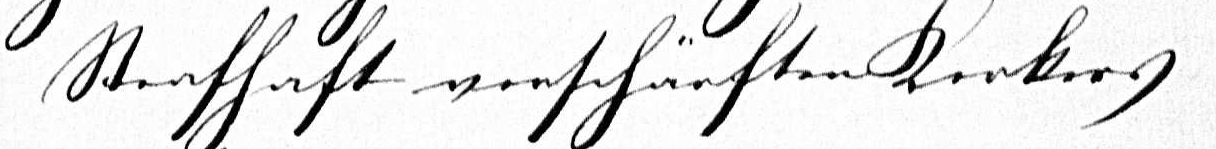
Straffakt verschärften Kerkers
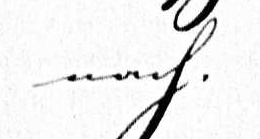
nach.
